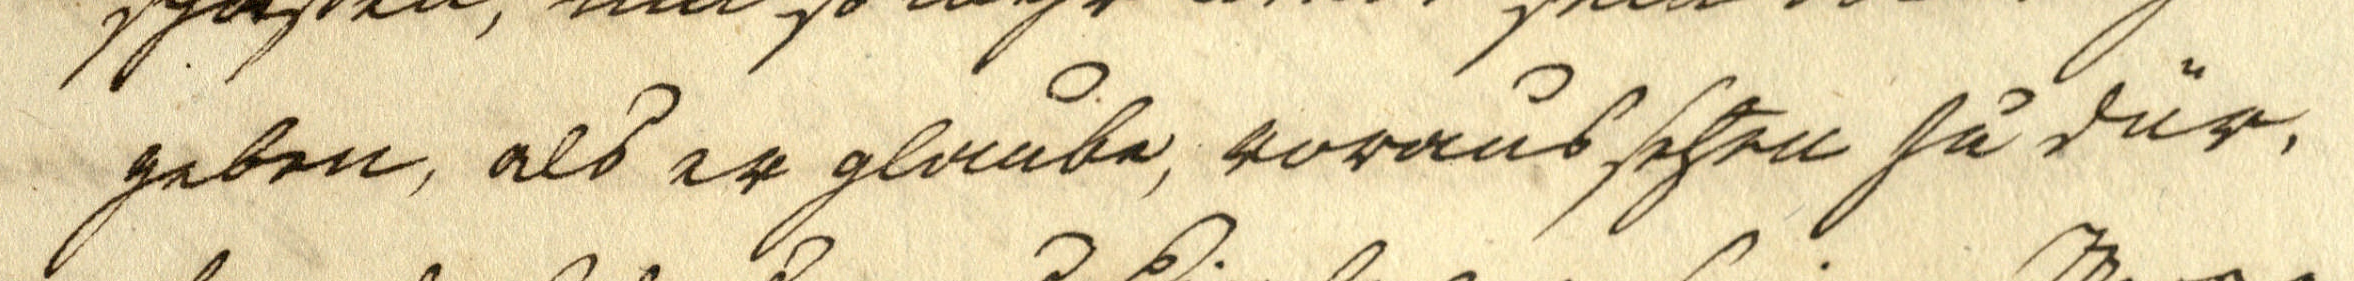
geben, als er glaube, voraussehen zu dür-
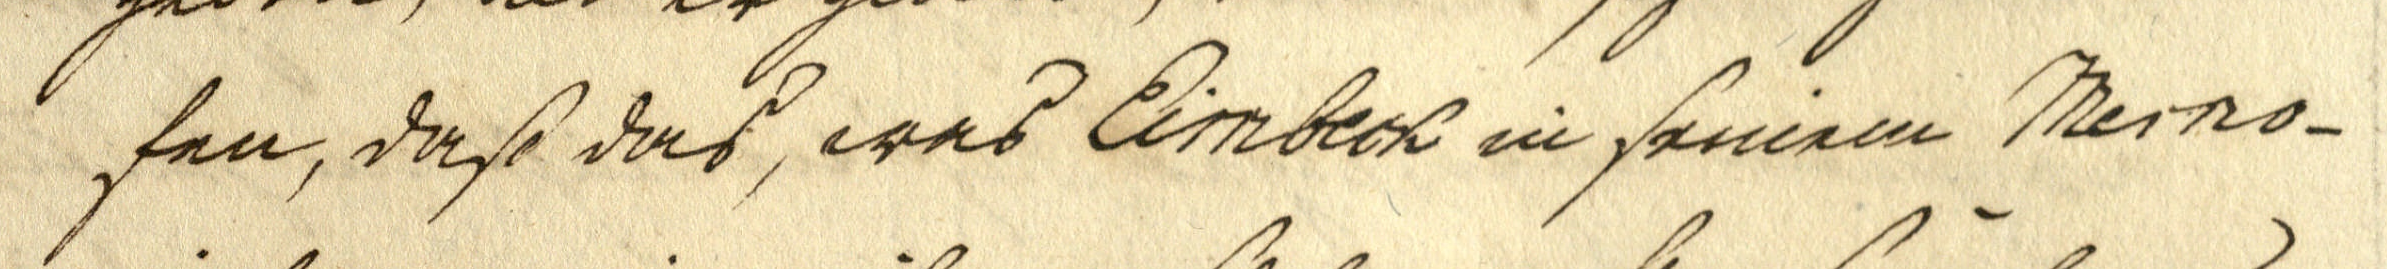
fen, daß das, was Eimbeck in seinem Memo-
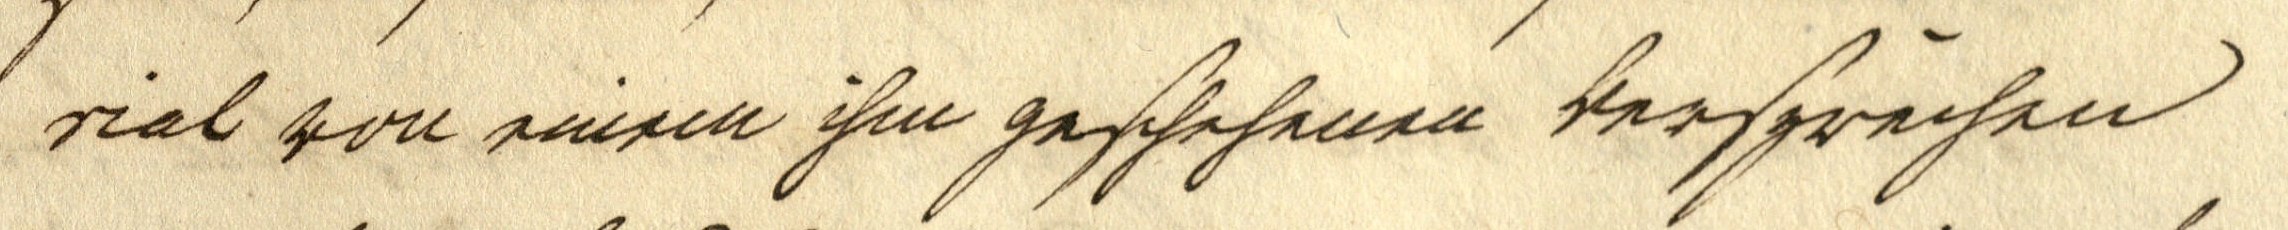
rial von einem ihm geschehenen Versprechen
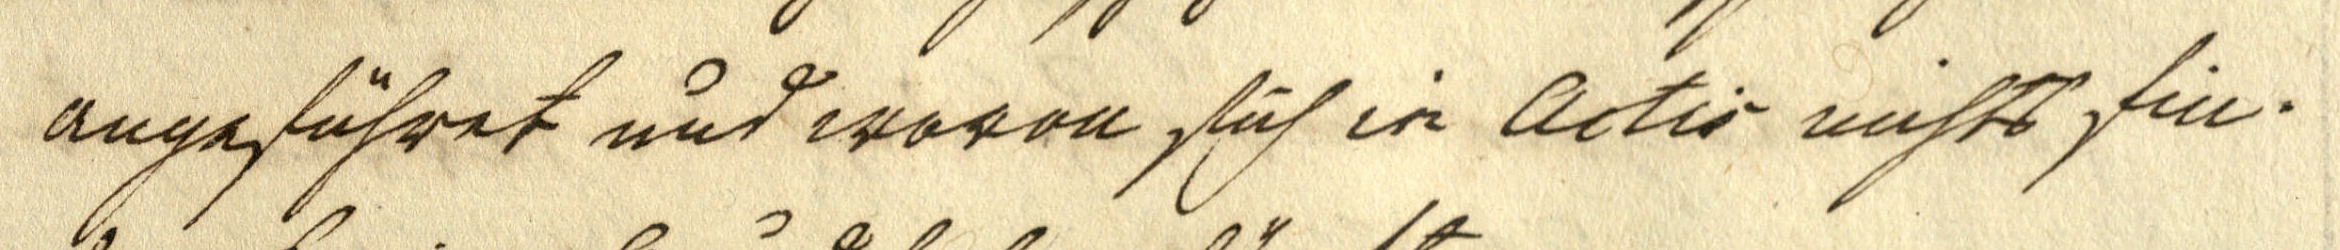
angeführet und wovon sich in Actis nichts fin-
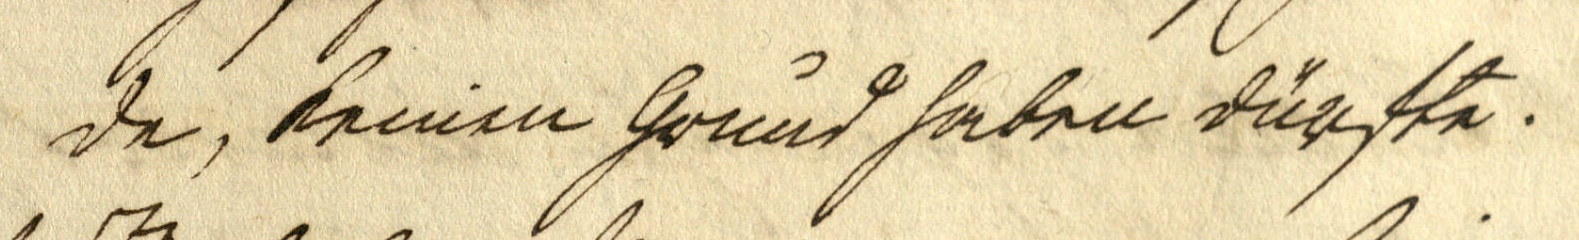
de, keinen Grund haben dürfte
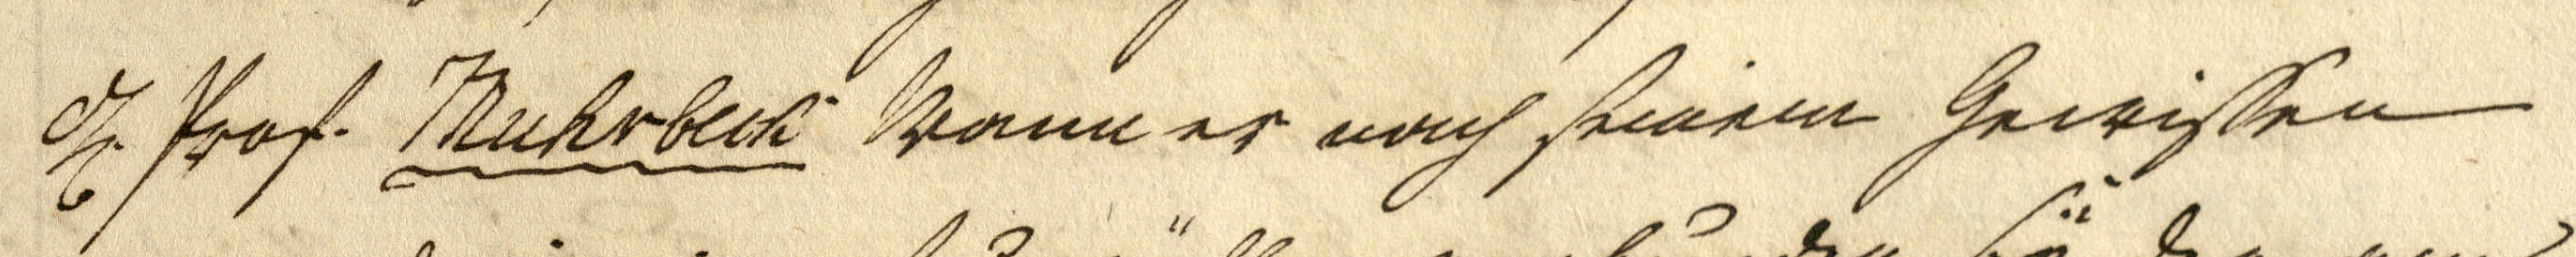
dh. Prof. Muhrbeck Wann er nach seinem Gewissen
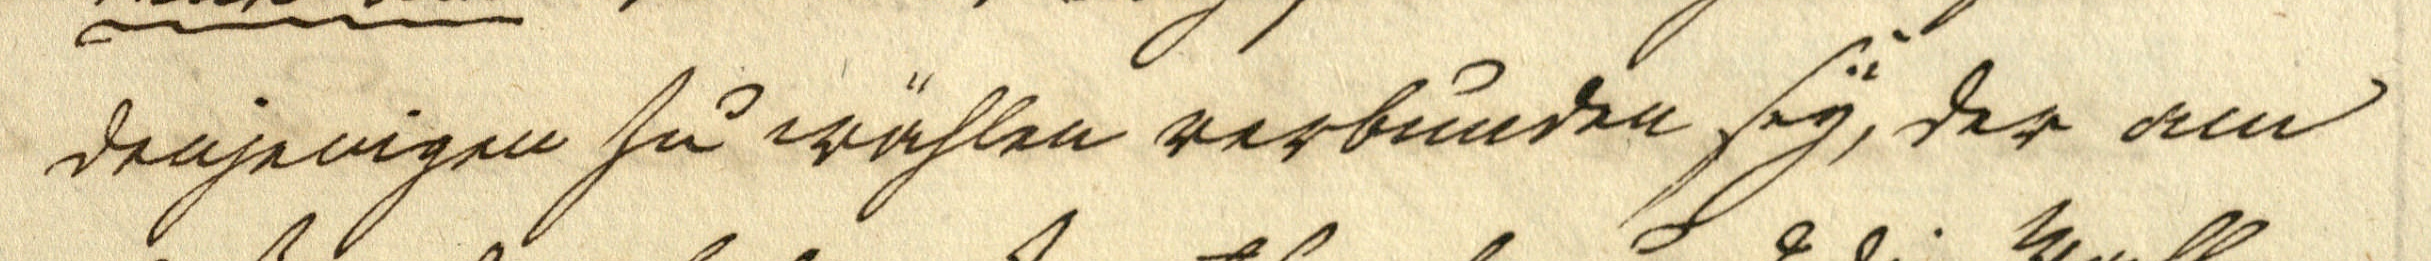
denjenigen zu wählen verbunden sey, der am
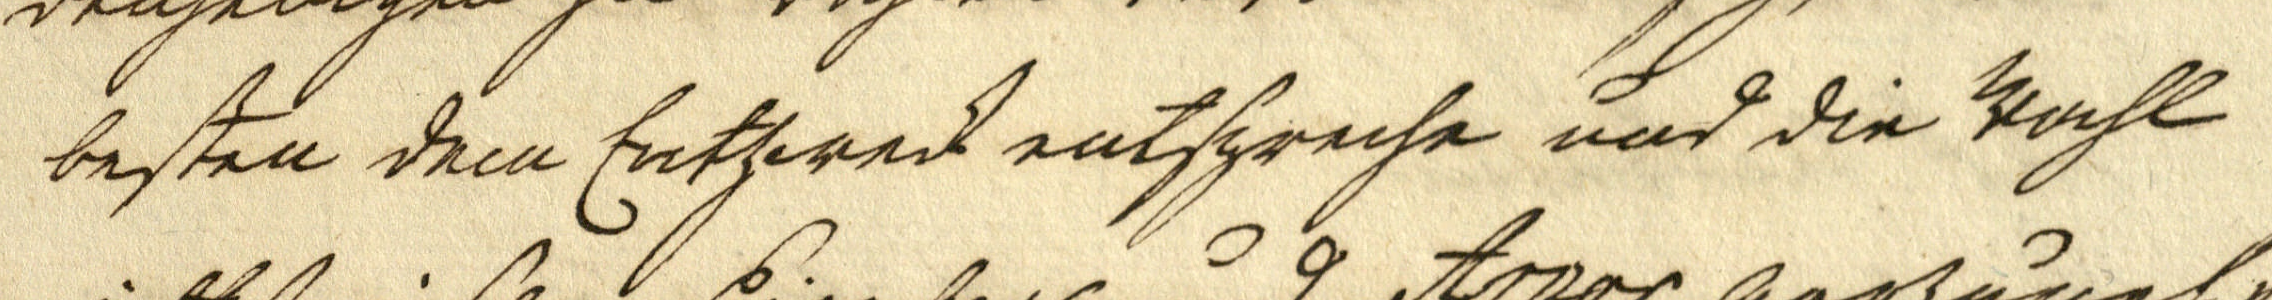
besten dem Entzwek entspreche und die Wahl
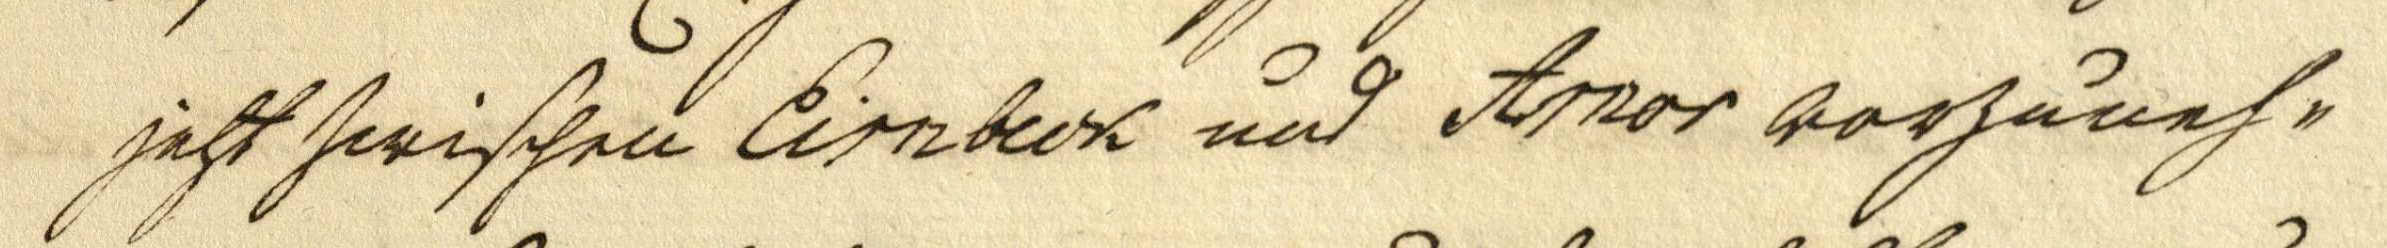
jetzt zwischen Eimbeck und Amor vorzuneh-
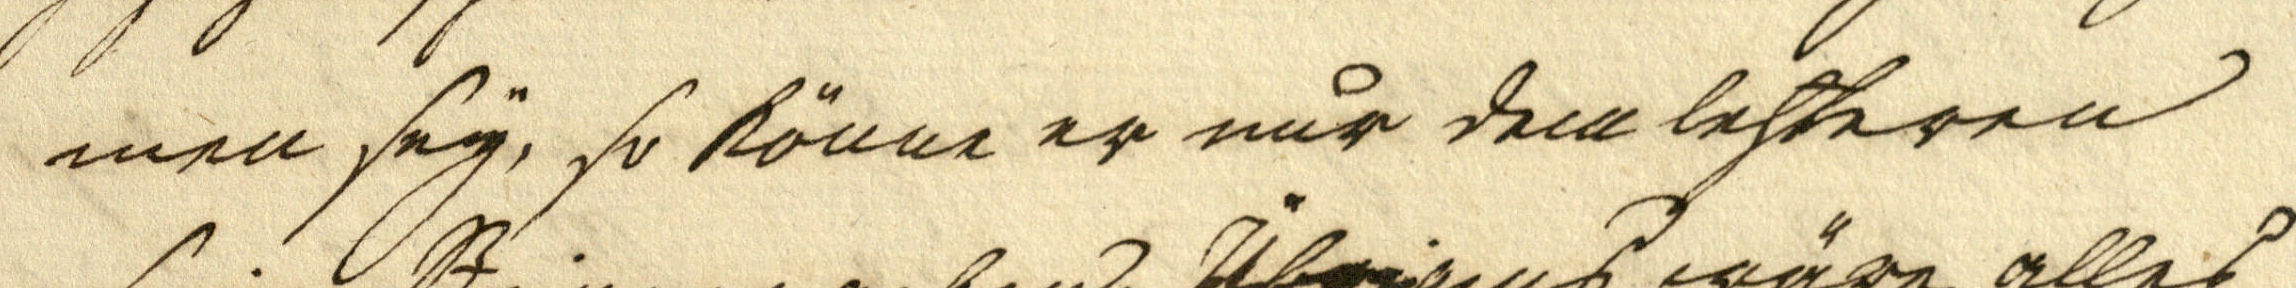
men sey, so könne er nur dem letzteren
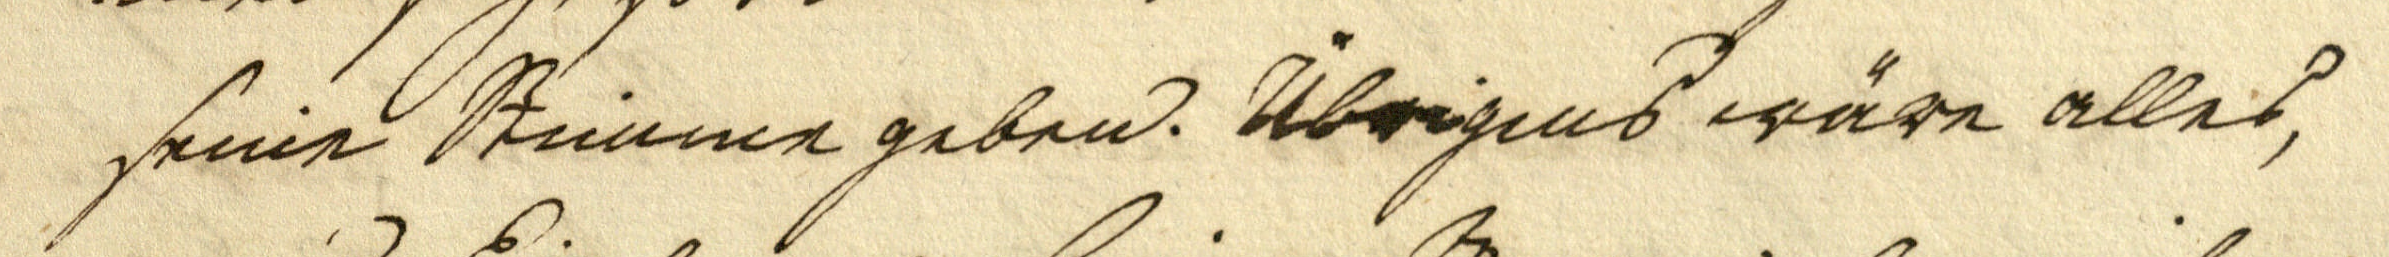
seine Stimme geben. Übrigens wäre alles,
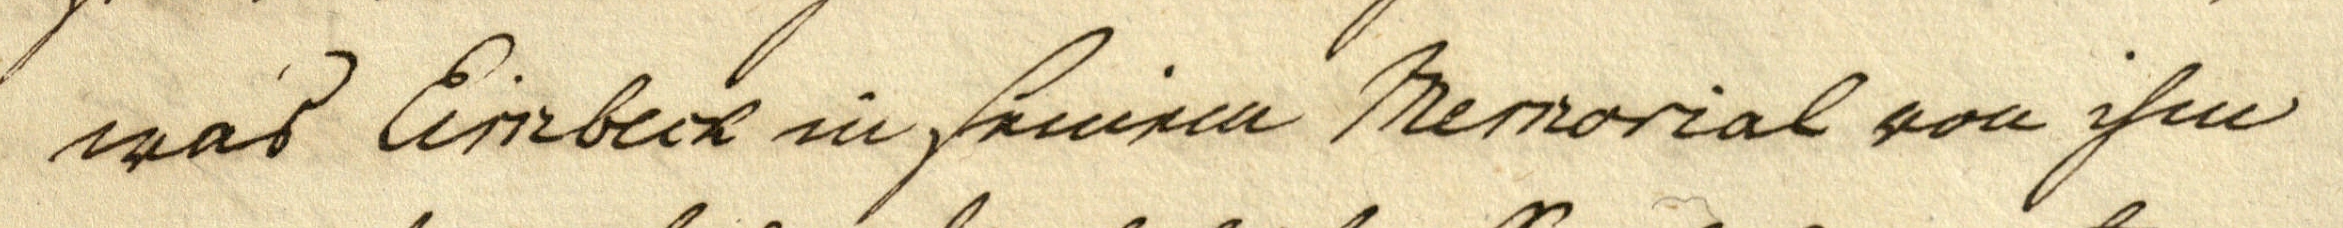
was Eimbeck in seinem Memorial von ihm
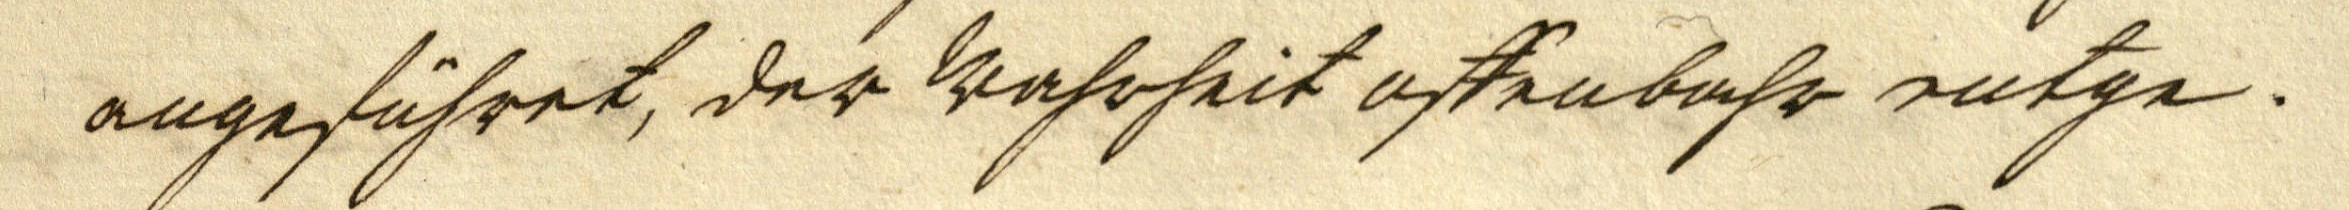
angeführet, der Wahrheit offenbahr entge-
